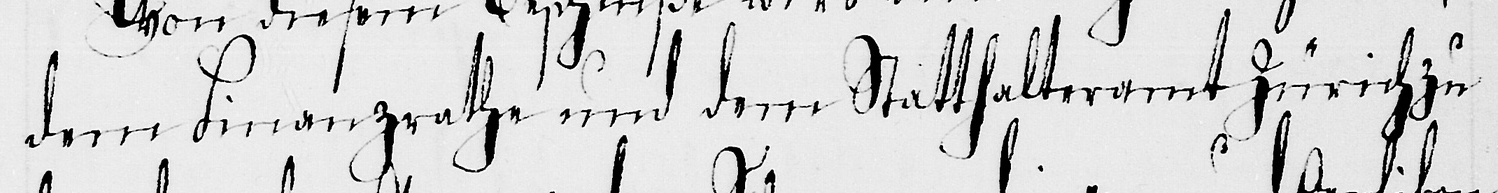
dem Finanzrathe und dem Statthalteramt Zürich zu
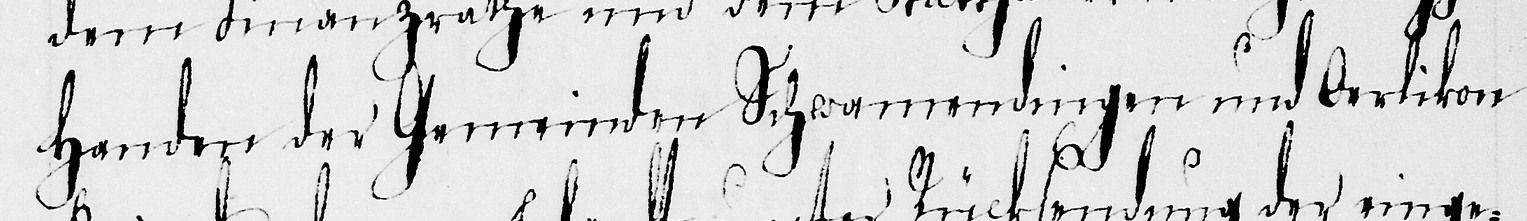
Handen der Gemeinden Schwamendingen und Oerlikon
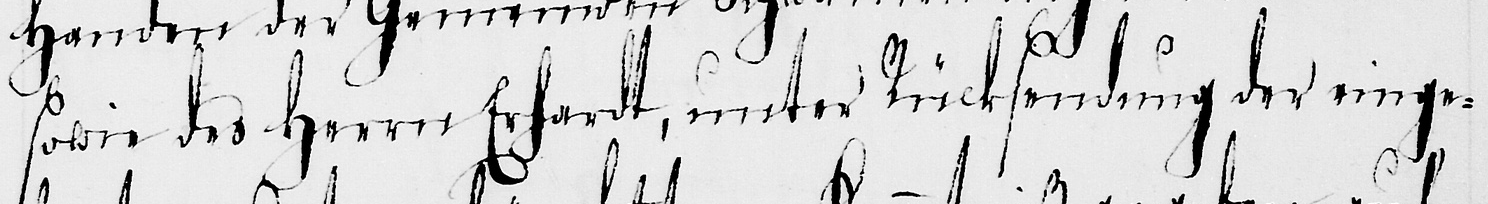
sowie des Herrn Erhardt, unter Rücksendung der einge¬
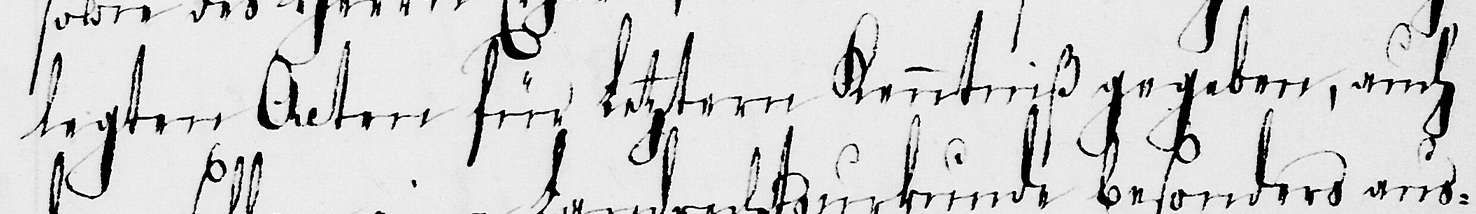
legten Acten für Letztern Kenntniß gegeben, auch
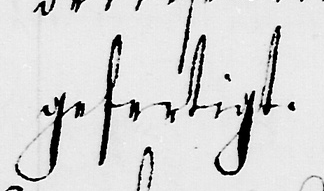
gefertigt.
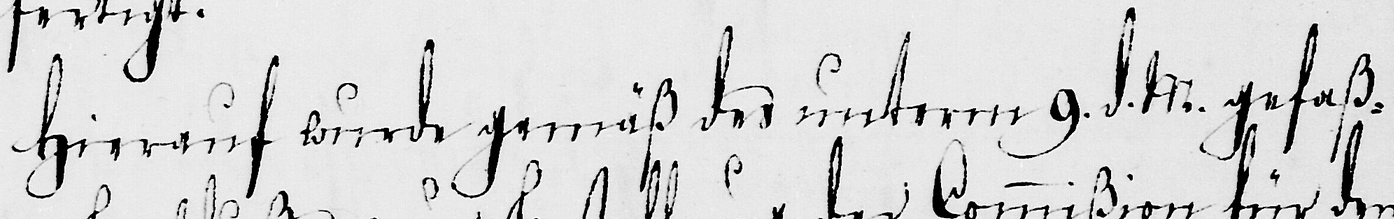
Hierauf wurde gemäß des unterm 9. d. M. gefaß¬
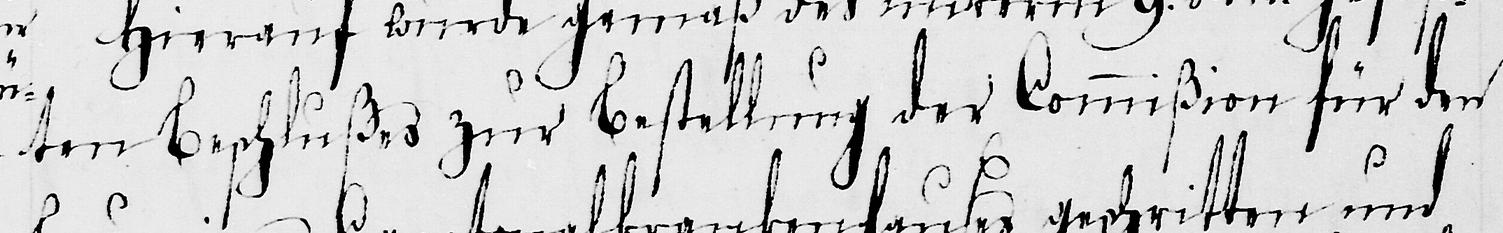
ten Beschlußes zur Bestellung der Commißion für den
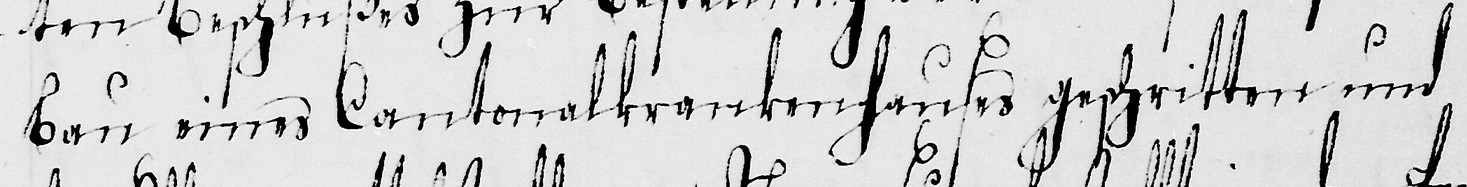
Bau eines Cantonalkrankenhauses geschritten und
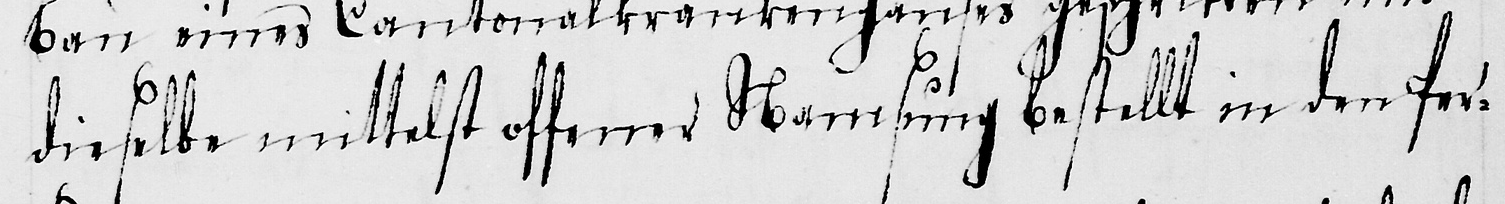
dieselbe mittelst offener Namsung bestellt in den Per¬
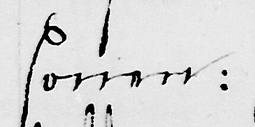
sonen:
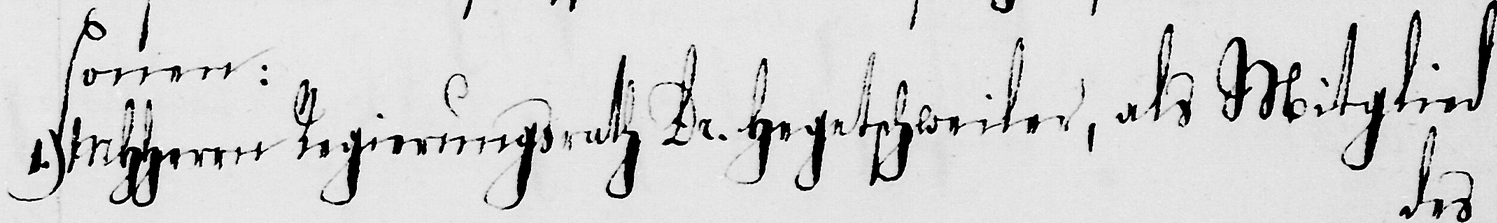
MHHerrn Regierungsrath Dr. Hegetschweiler, als Mitglied
